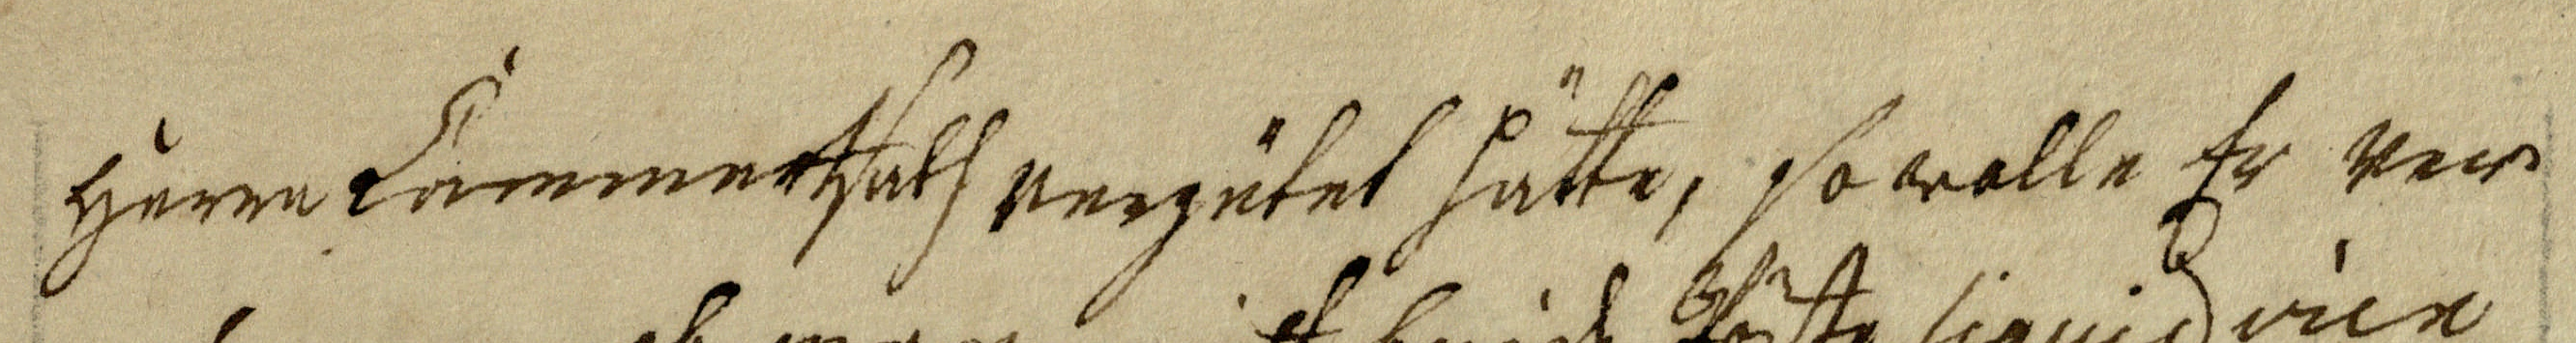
Herrn CammertRath vergütet hätte, so wolle Er ver¬
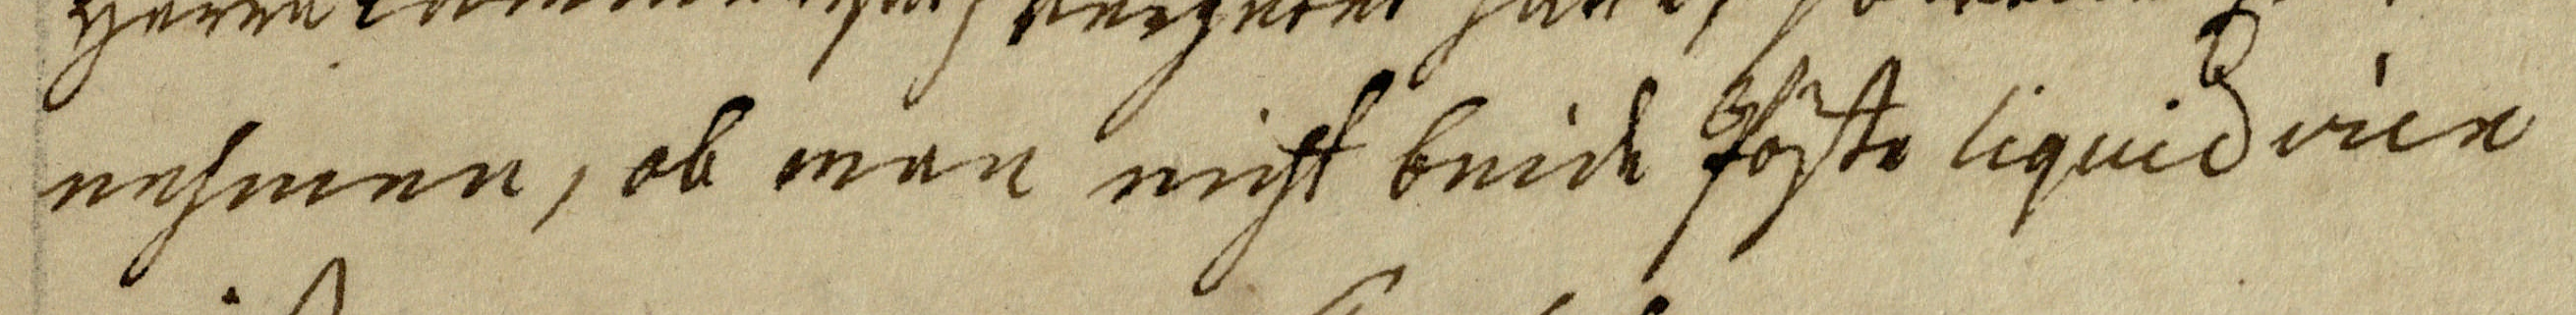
nehmen, ob man nicht beide Pöste liquidiren
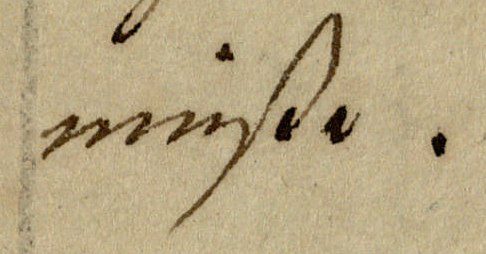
müße,
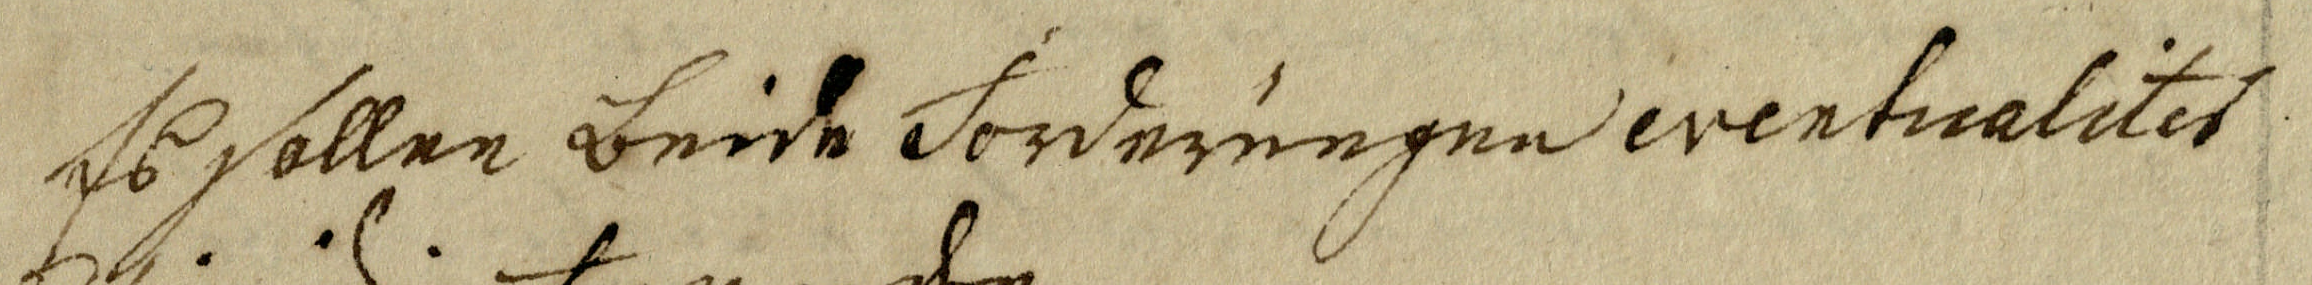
Es sollen beide Forderungen eventualiter
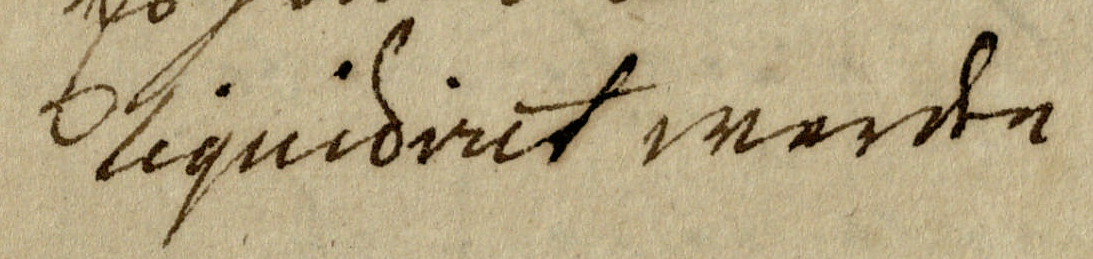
liquidiret werden
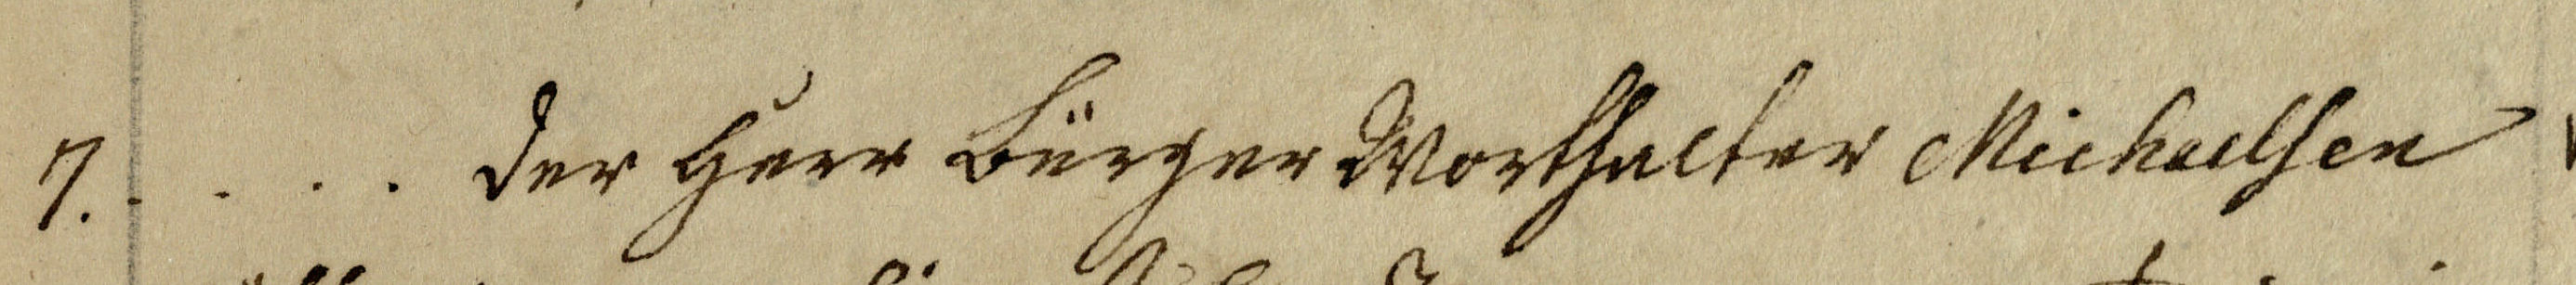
7. der Herr Bürger Worthalter Michaelsen
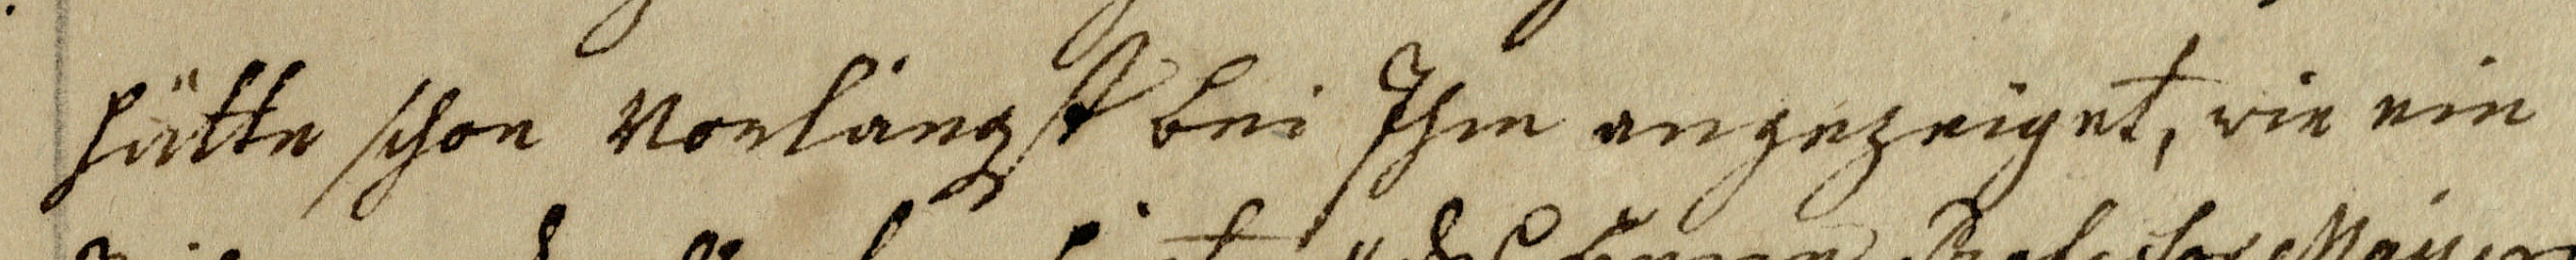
hätte schon vorlängst bei Ihm angezeiget, wie ein
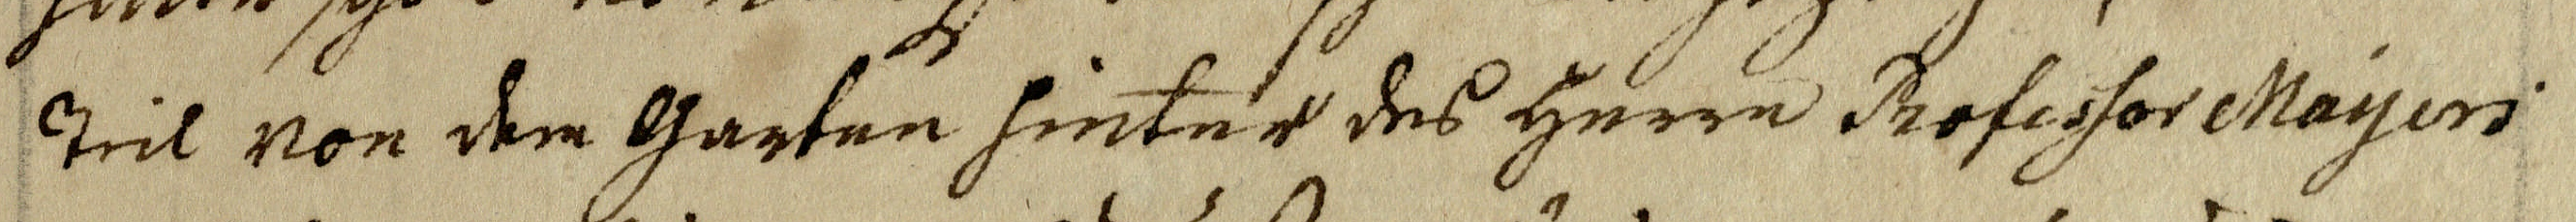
Teil von dem Garten hinter des Herrn Professor Maÿers
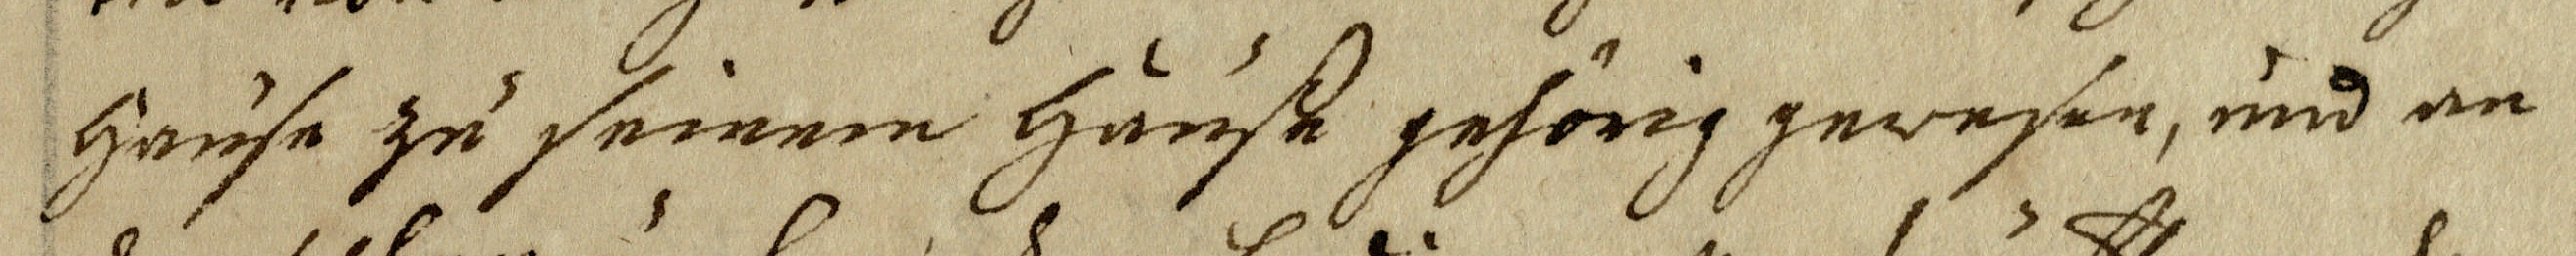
Hause zu seinem Hause gehörig gewesen, und an
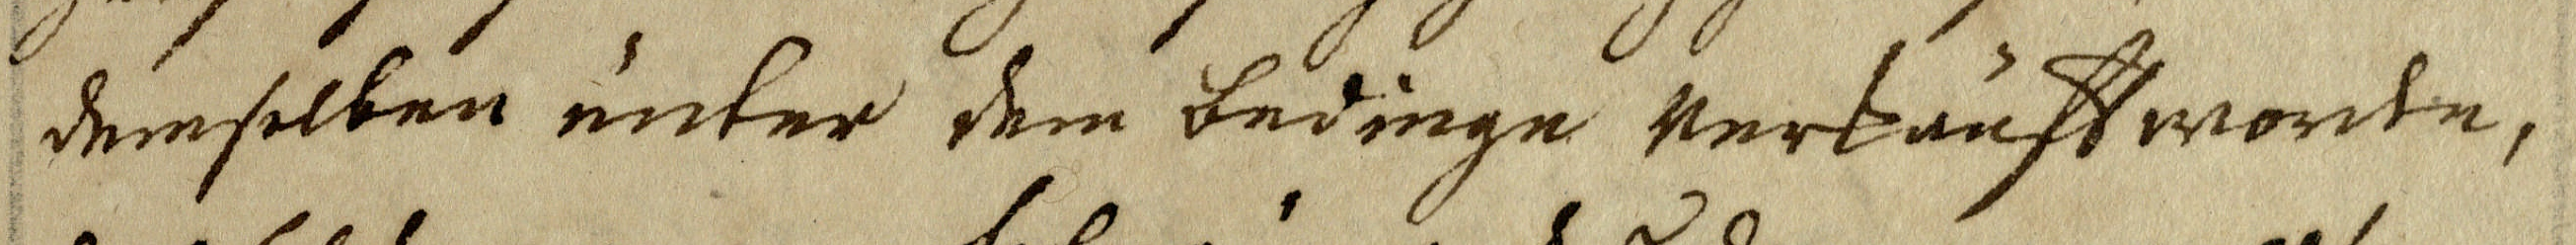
demselben unter dem Bedinge verkauft worden,
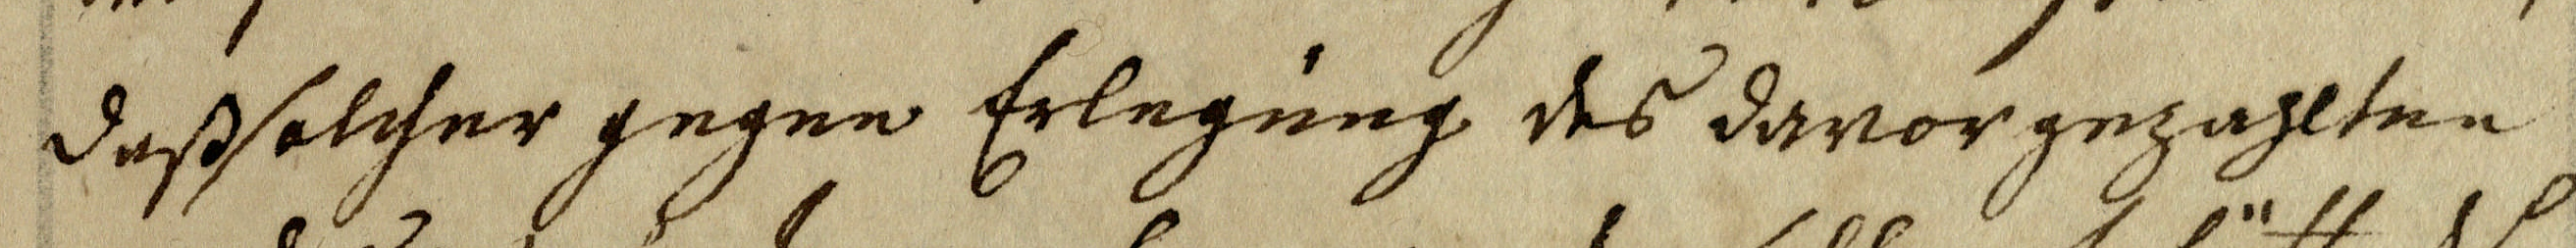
daß solcher gegen Erlegung des davor gezahlten
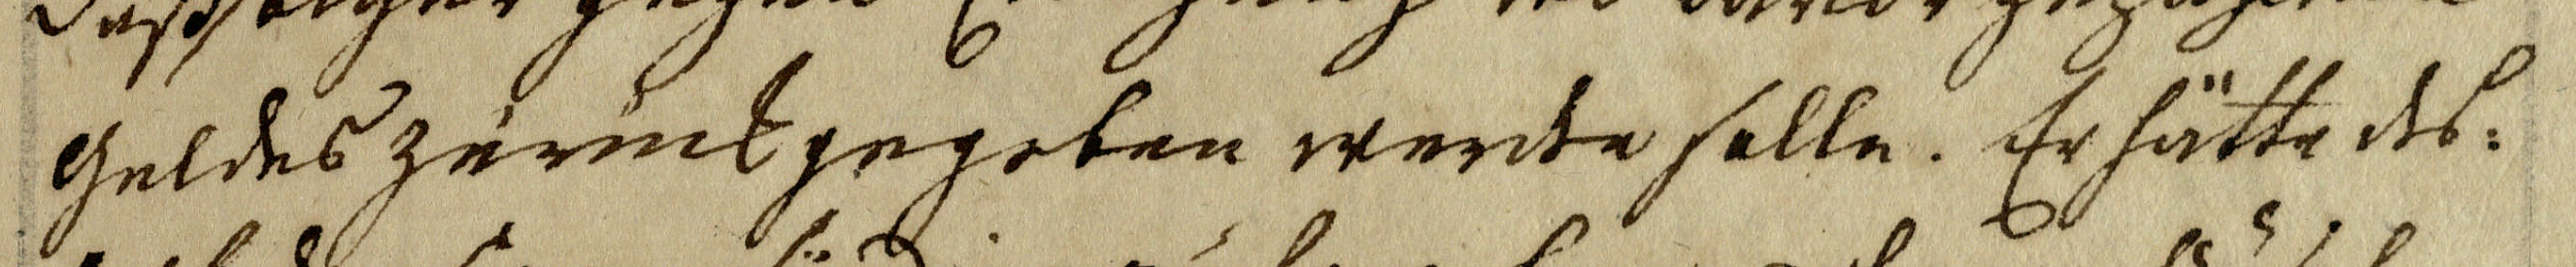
Geldes zurückgegeben werden solle. Er hätte des¬
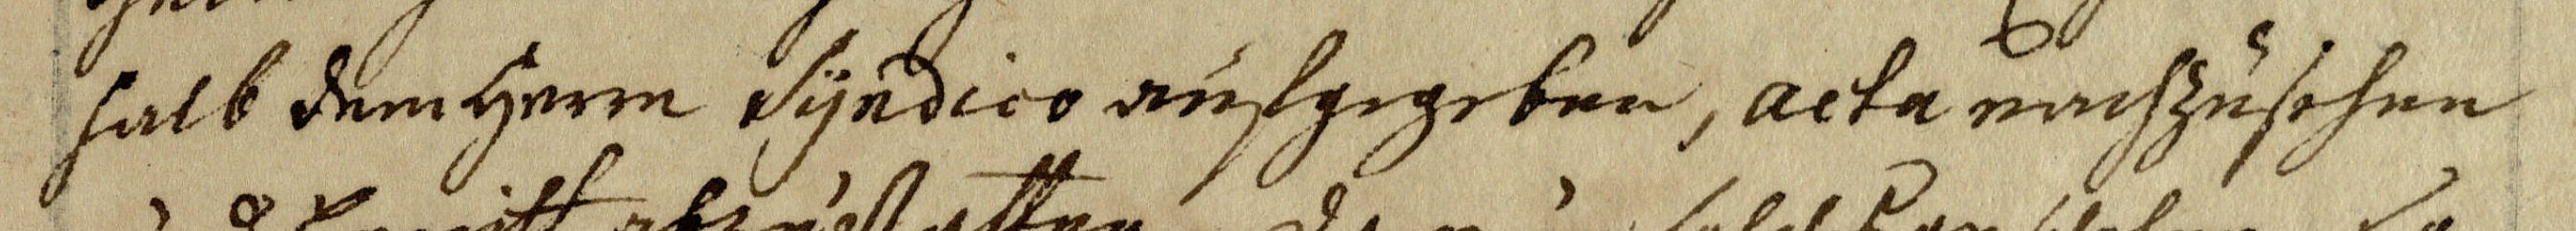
halb dem Herrn Sÿndico aufgegeben, Acta nachzusehen
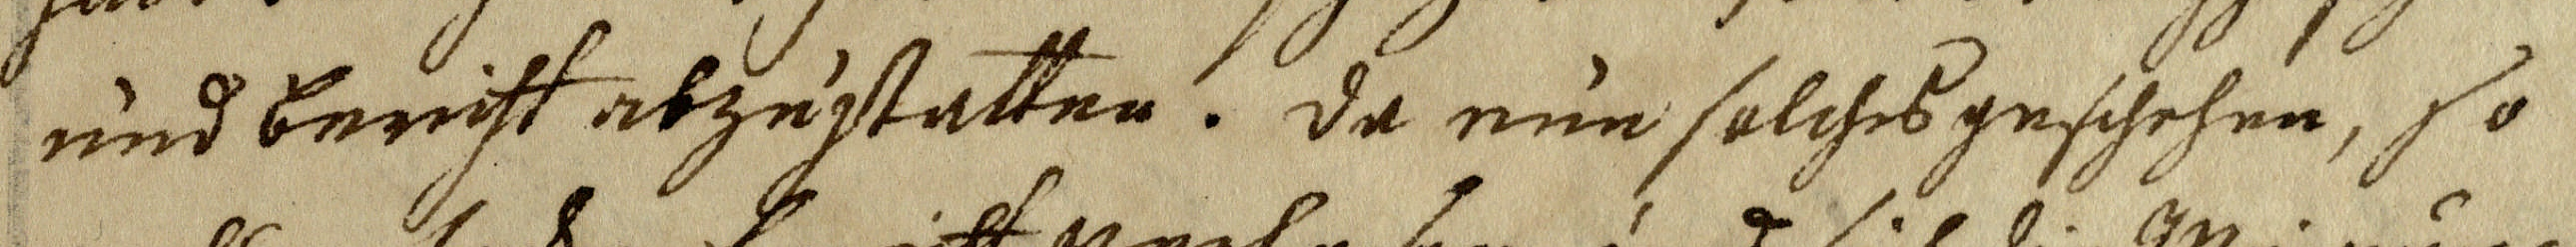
und Bericht abzustatten. Da nun solches geschehen, so
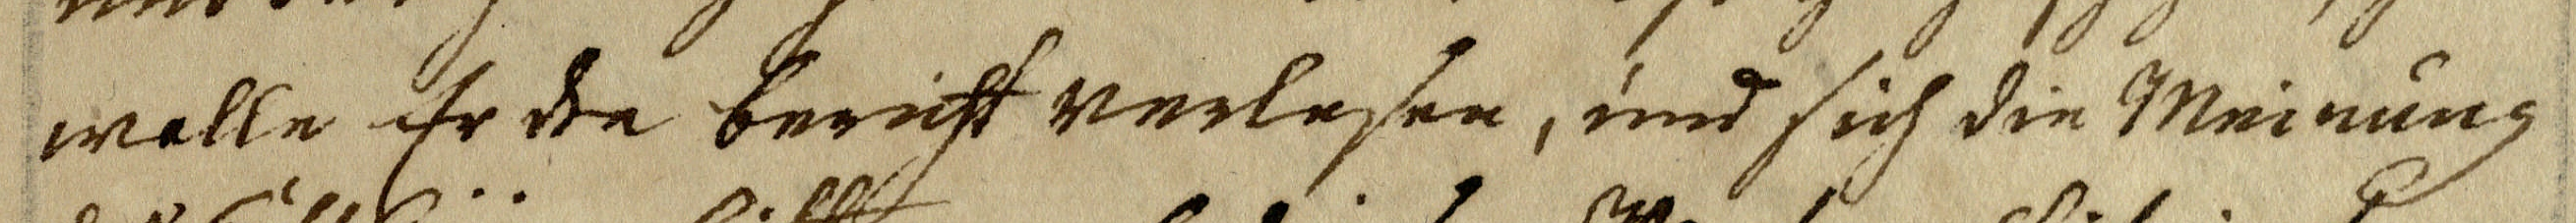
wolle Er den Bericht verlesen, und sich die Meinung
